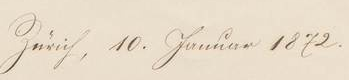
Zürich, 10. Januar 1872.
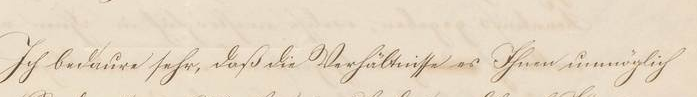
Ich bedaure sehr, daß die Verhältnisse es Ihnen unmöglich
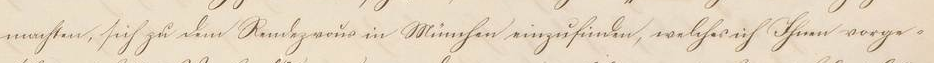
machen, sich zu dem Rendezvous in München einzufinden, welches ich Ihnen vorge-
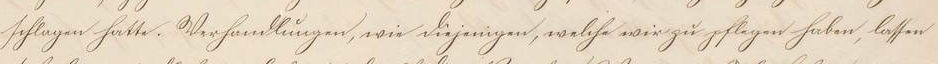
schlagen hatte. Verhandlungen, wie diejenigen, welche wir zu pflegen haben, lassen
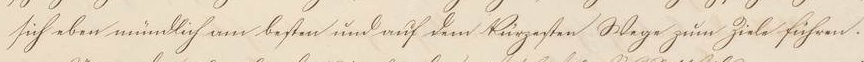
sich eben mündlich am besten und auf dem kürzesten Wege zum Ziele führen.
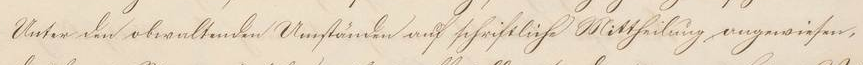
Unter den obwaltenden Umständen auf schriftliche Mittheilung angewiesen,
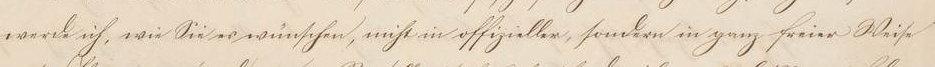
werde ich, wie Sie es wünschen, nicht in offizieller, sondern in ganz freier Weise
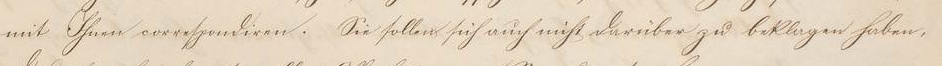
mit Ihnen correspondiren. Sie sollen sich auch nicht darüber zu beklagen haben,
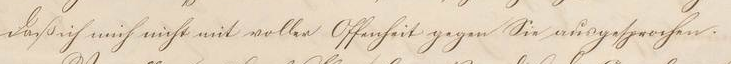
daß ich mich nicht mit voller Offenheit gegen Sie ausgesprochen.
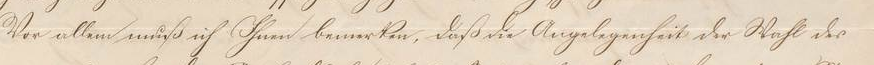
Vor allem muß ich Ihnen bemerken, daß die Angelegenheit der Wahl des
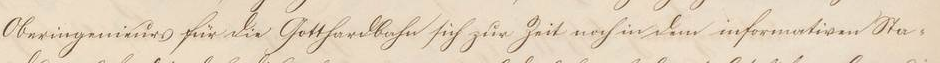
Oberingenieurs für die Gotthardbahn sich zur Zeit noch in dem informativen Sta-
